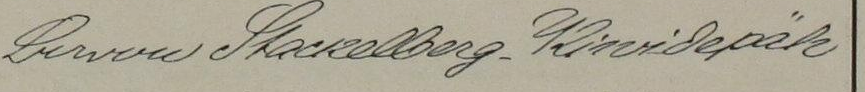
Baron Stackelberg-Kiwidepäh
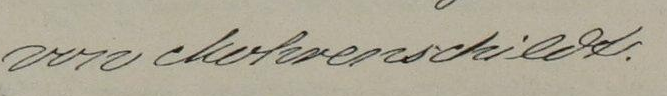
von Mohrenschildt.
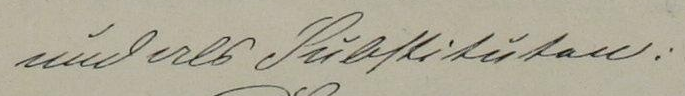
und als Substituten:
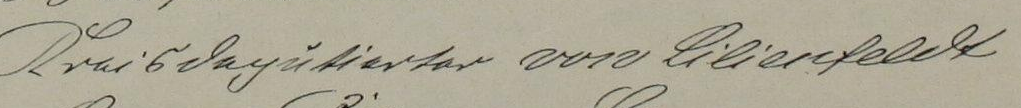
Kreisdeputierter von Lilienfeldt
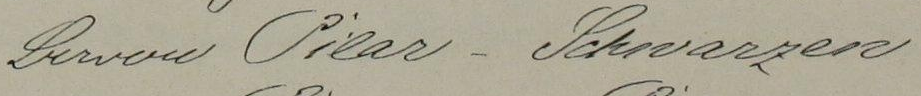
Baron Pilar-Schwarzen
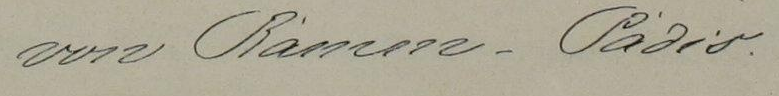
von Ramm-Padis.
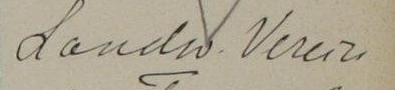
Landw. Verein
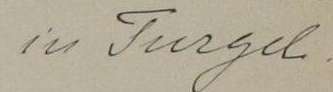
in Turgel
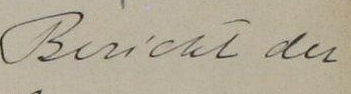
Bericht der
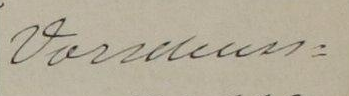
Vorschuss-
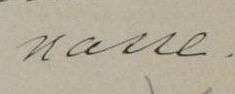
kasse
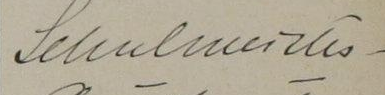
Schulmeister-
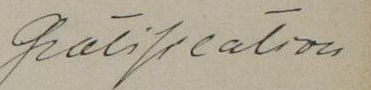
Gratification
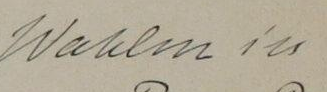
Wahlen in
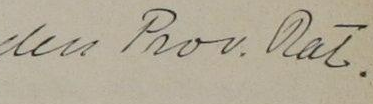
den Prov. Rat.
